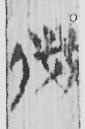俴
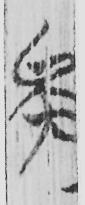矣
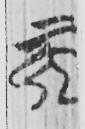而
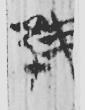隹
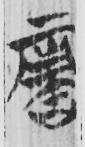啻
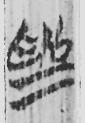爲
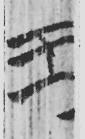王
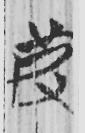皮
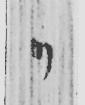人
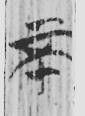不
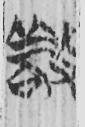敬
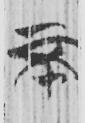不
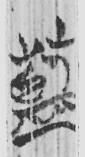藍
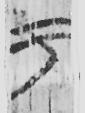于
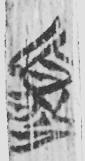{日止頁}（夏）
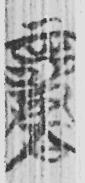商
